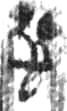想
